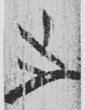之
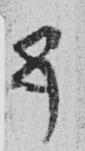邑
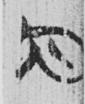亦
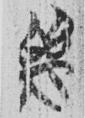樂
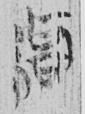○（治）
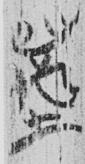○（萬）
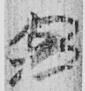室
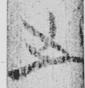之
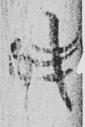邦
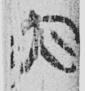亦
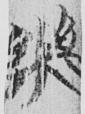樂
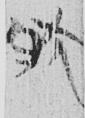肰（然）
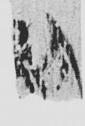則
